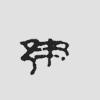隹
